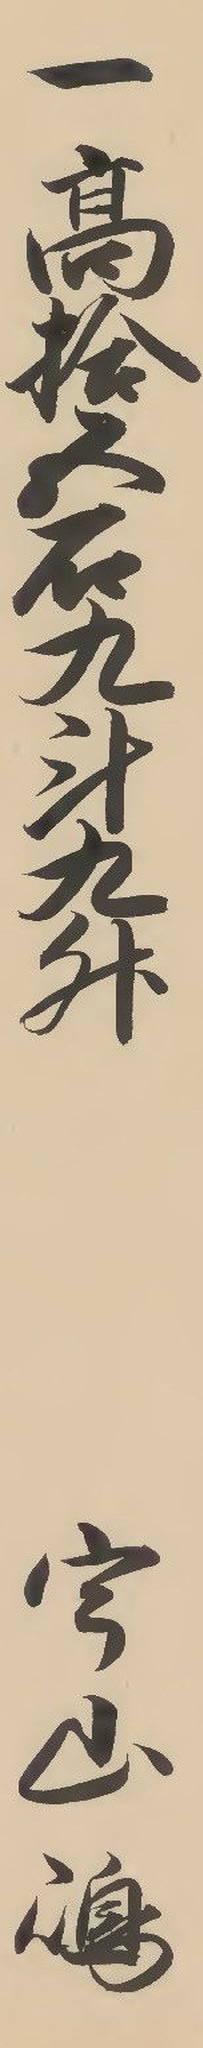一高拾五石九斗九升宇山島
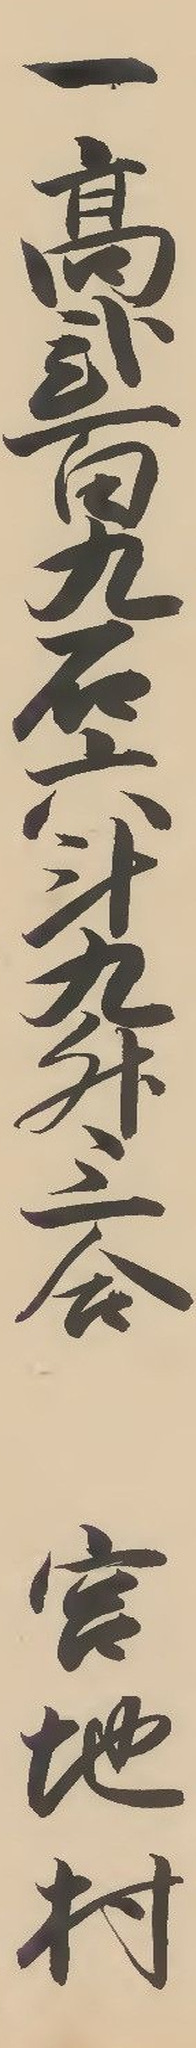一高弐百九石六斗九升三合宮地村

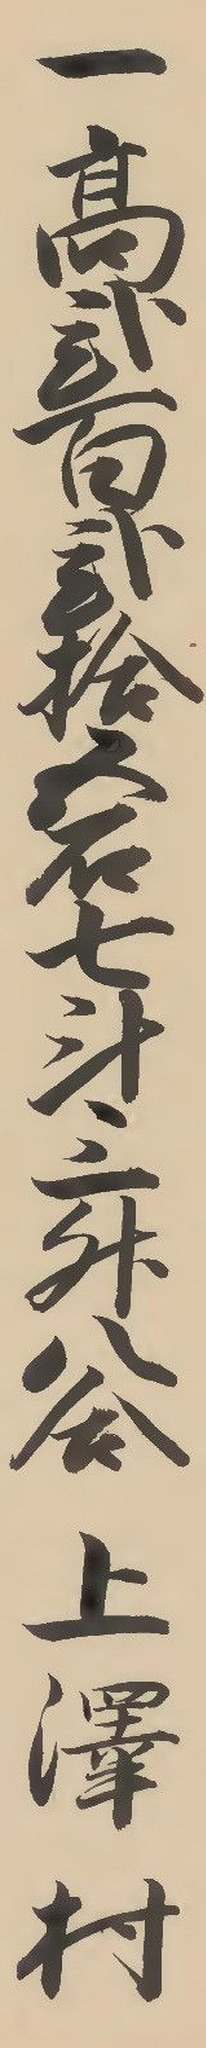一高弐百弐拾五石七斗三升八合上沢村
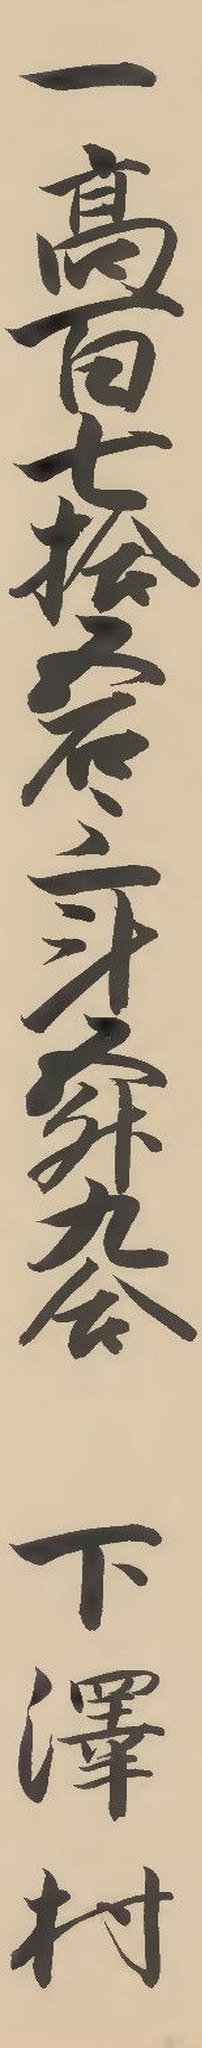一高百七拾五石三斗五升九合下沢村
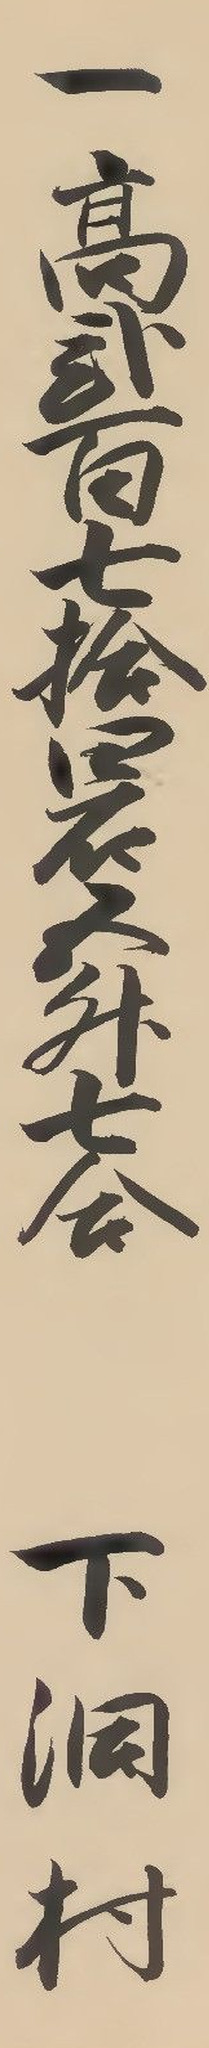一高弐百七拾四石五升七合下洞村
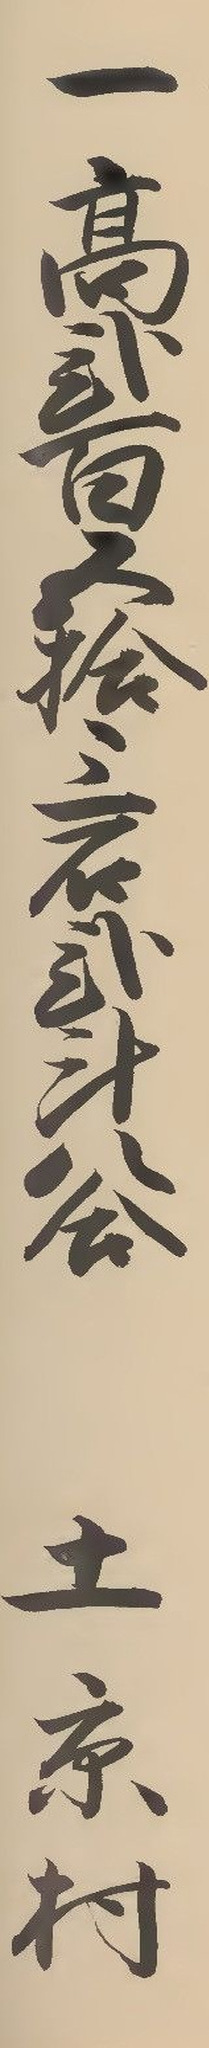一高弐百五拾三石弐斗八合土京村
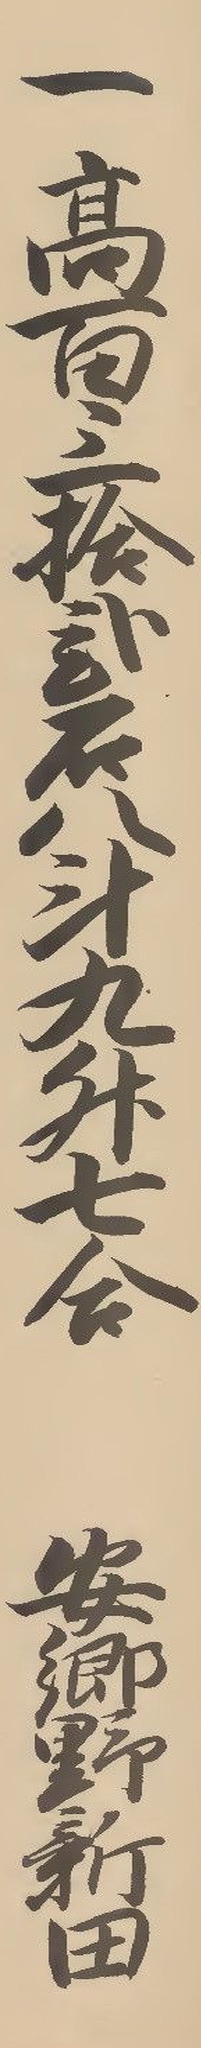一高百三拾弐石八斗九升七合安郷野新田
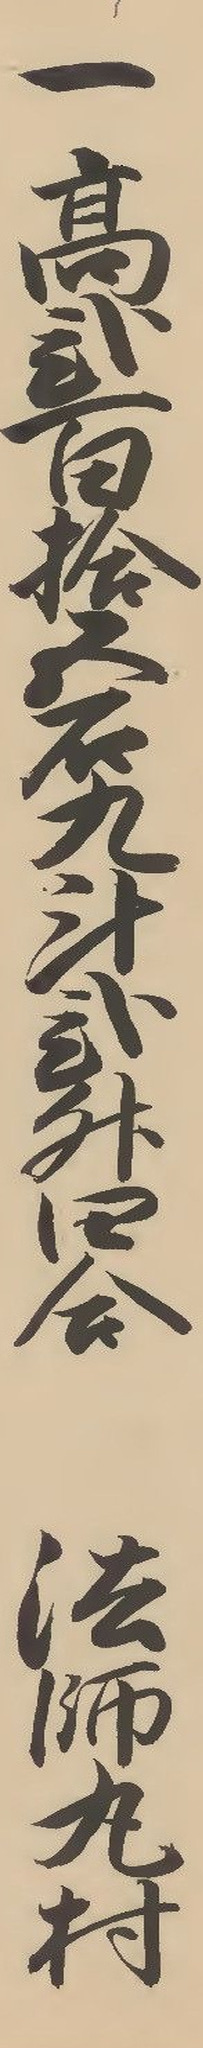一高弐百拾五石九斗弐升四合法師丸村
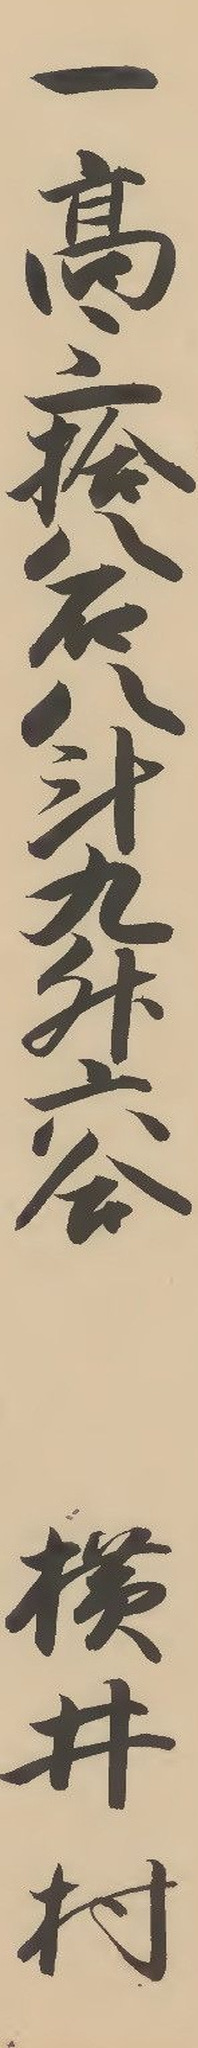一高三拾八石八斗九升六合横井村
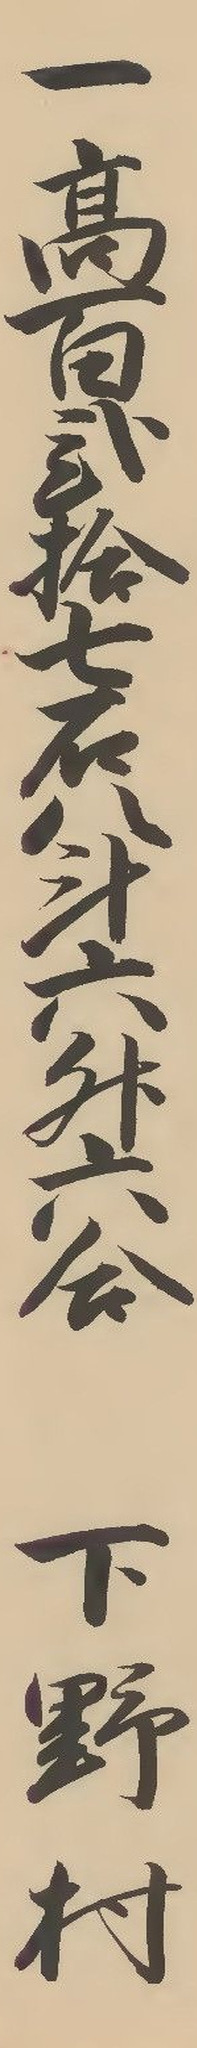一高百弐拾七石八斗六升六合下野村

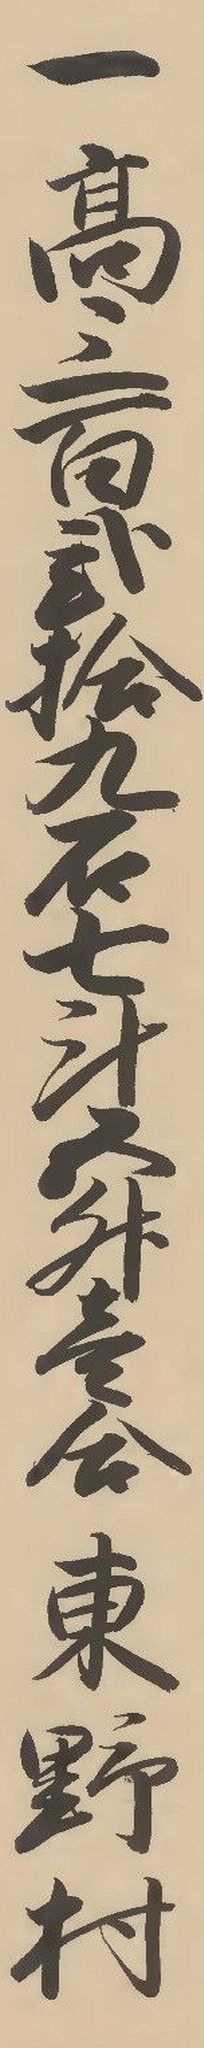一高三百弐拾九石七斗五升壱合東野村
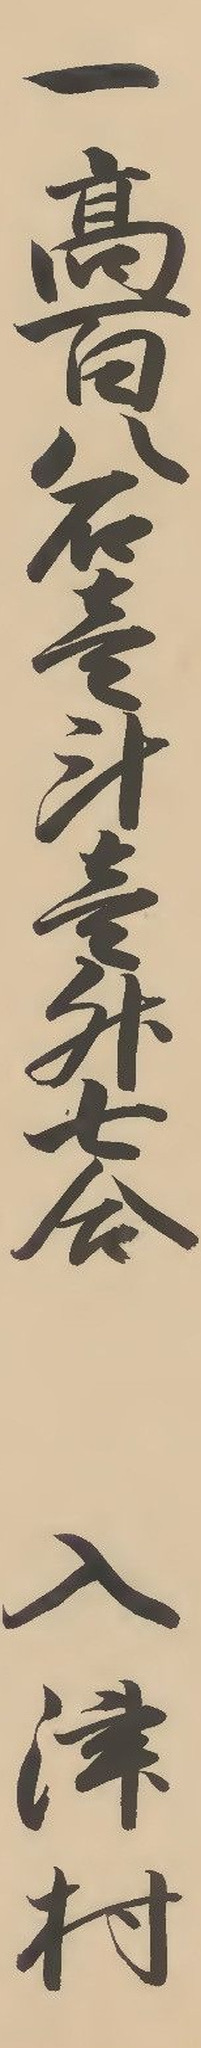一高百八石壱斗壱升七合入津村
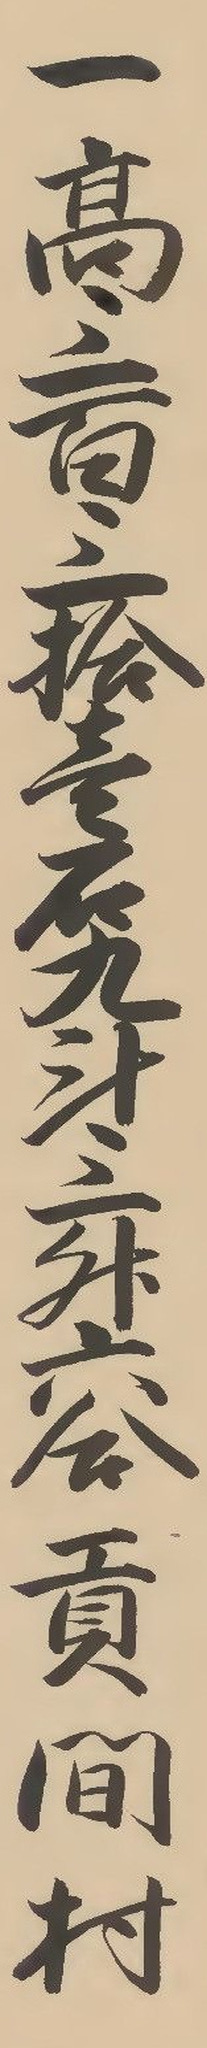一高三百三拾壱石九斗三升六合貢間村
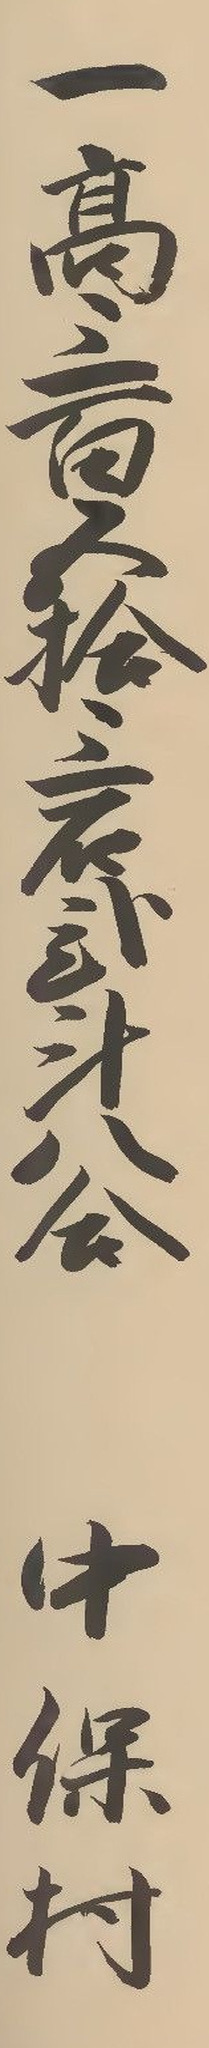一高三百五拾三石弐斗八合中保村
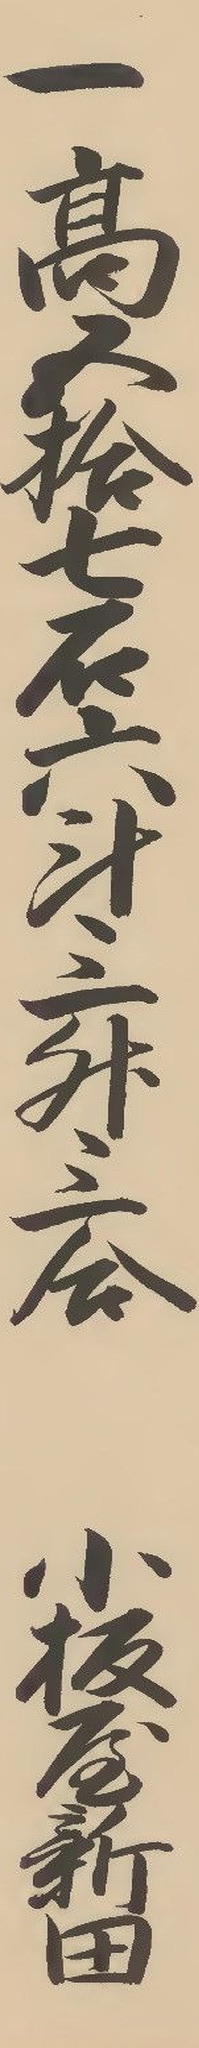一高五拾七石六斗三升三合小板屋新田
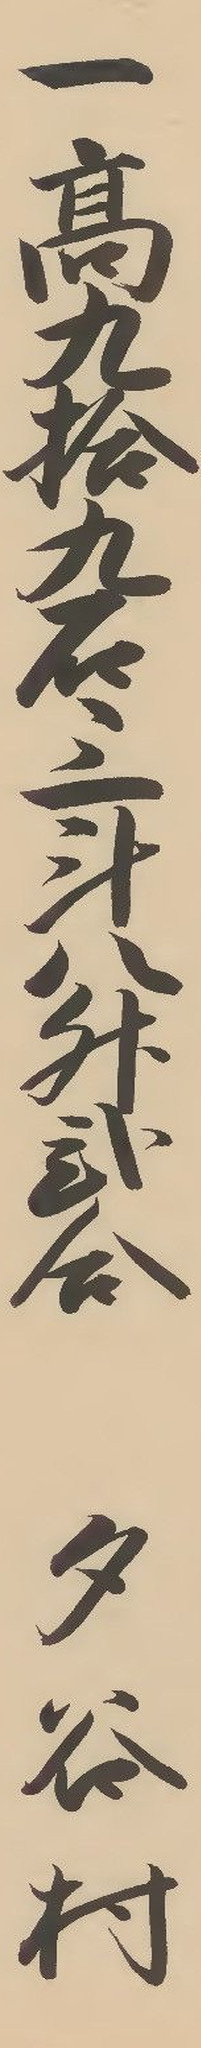一高九拾九石三斗八升弐合夕谷村
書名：美濃国郷帳
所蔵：国立公文書館 National Archives of Japan
